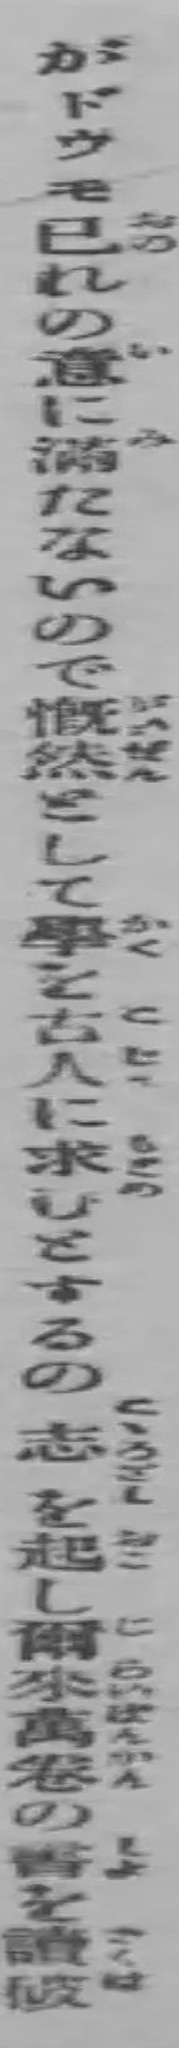がドウモ己れの意に満たないので慨然として学を古人に求むとするの志を起し爾来万巻の書を読破
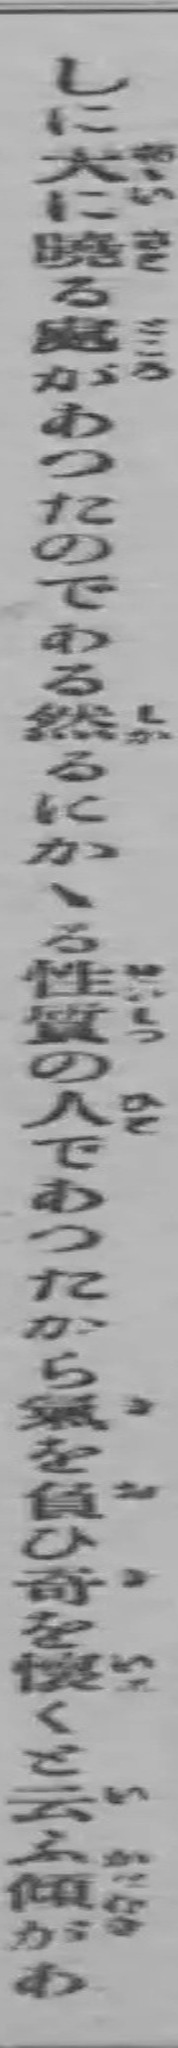しに大に暁る処があつたのである然るにかゝる性質の人であつたから気を負ひ奇を懐くと云ふ傾があ
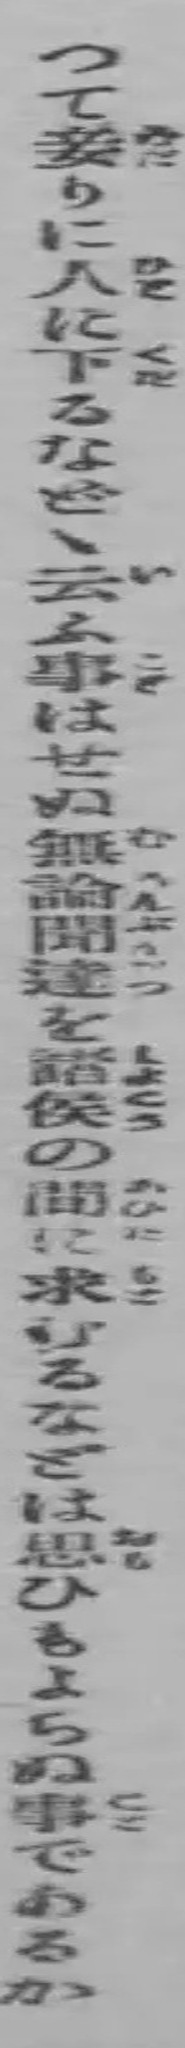つて妾りに人に下るなどゝ云ふ事はせぬ無論聞達を諸侯の間に求むるなどは思ひもよらぬ事であるか
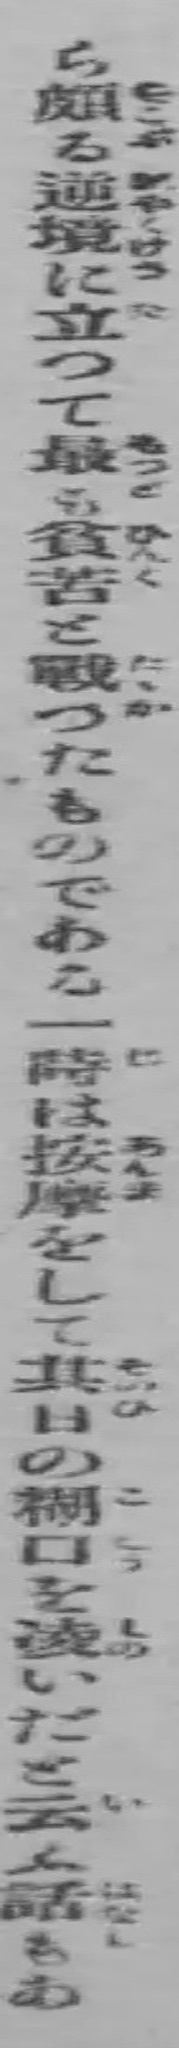ら頗る逆境に立つて最も貧苦と戦つたものである一時は按摩をして其日の糊口を凌いだと云ふ話もあ
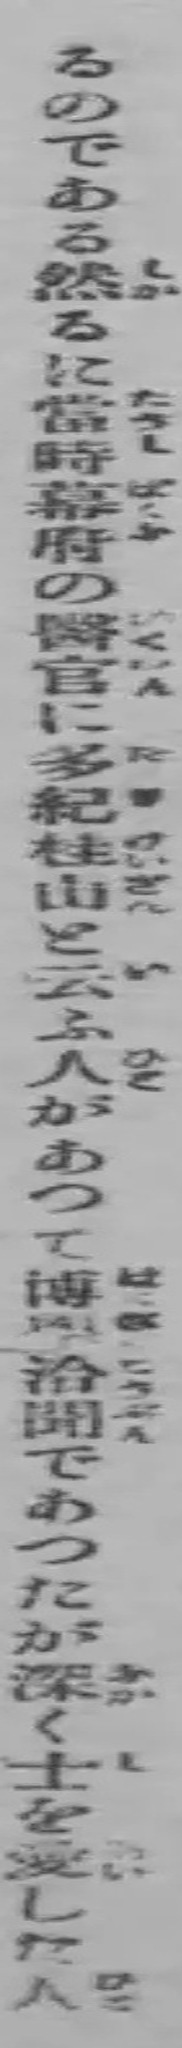るのである然るに当時幕府の医官に多紀桂山と云ふ人があつて博学洽聞であつたが深く士を愛した人
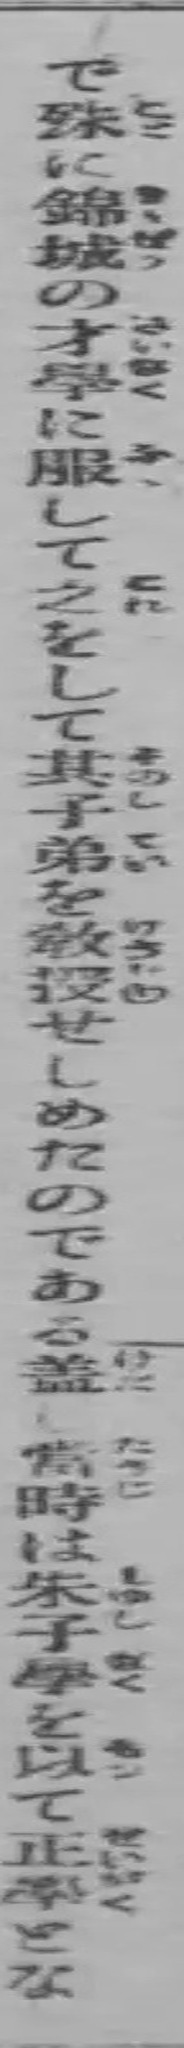で殊に錦城の才学に服して之を其子弟を教授せしめたのである蓋し当時は朱子学を以て正学とな
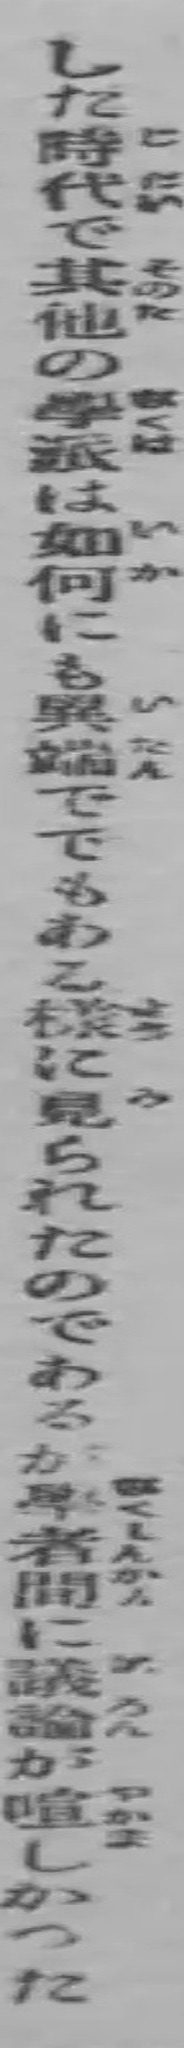した時代で其他の学派は如何にも異端ででもある様に見られたのであるが学者間に議論が喧しかつた
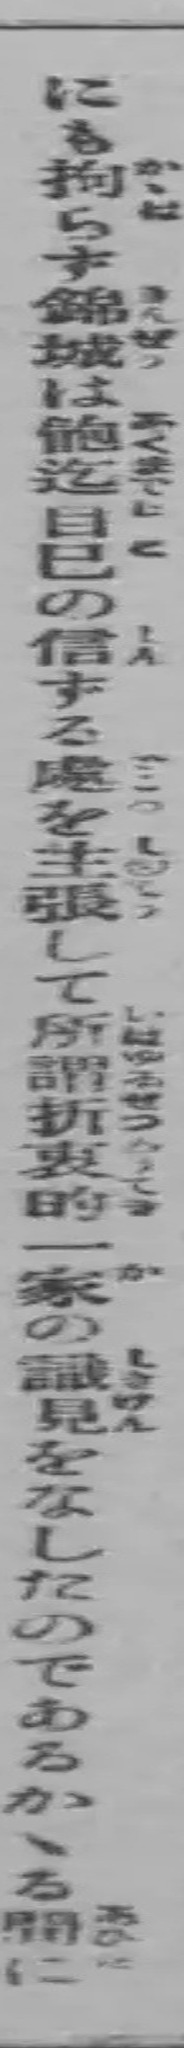にも拘らず錦城は飽迄自己の信ずる処を主張して所謂折衷的一家の識見をなしたのであるかゝる間に
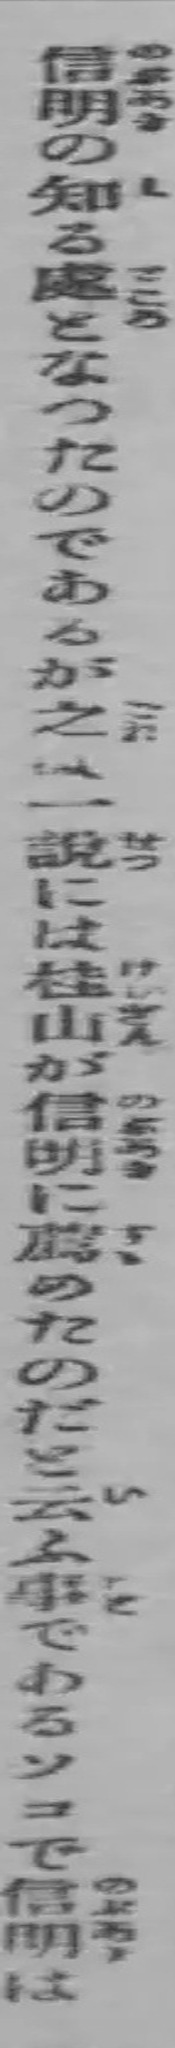信明の知る処となつたのであるが之は一説には桂山が信明に薦めたのだと云ふ事であるソコで信明は
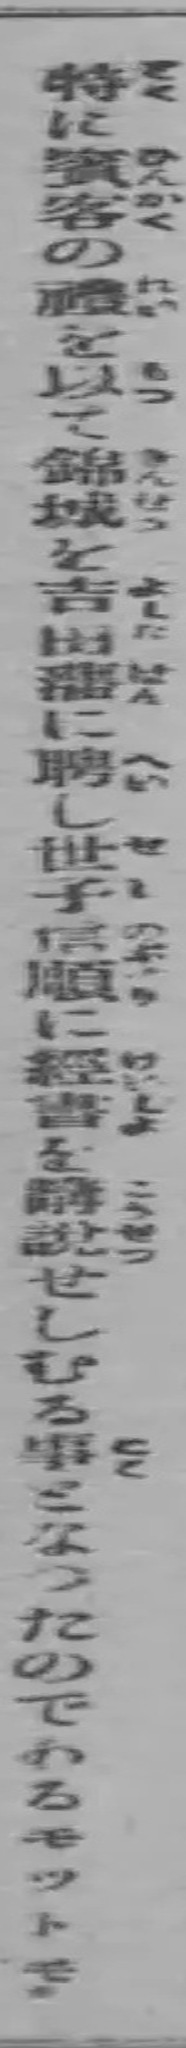錦城と信明特に賓客の礼を以て錦城を吉田藩に聘し世子信順に経書を講説せしむる事となつたのであるモツトモ

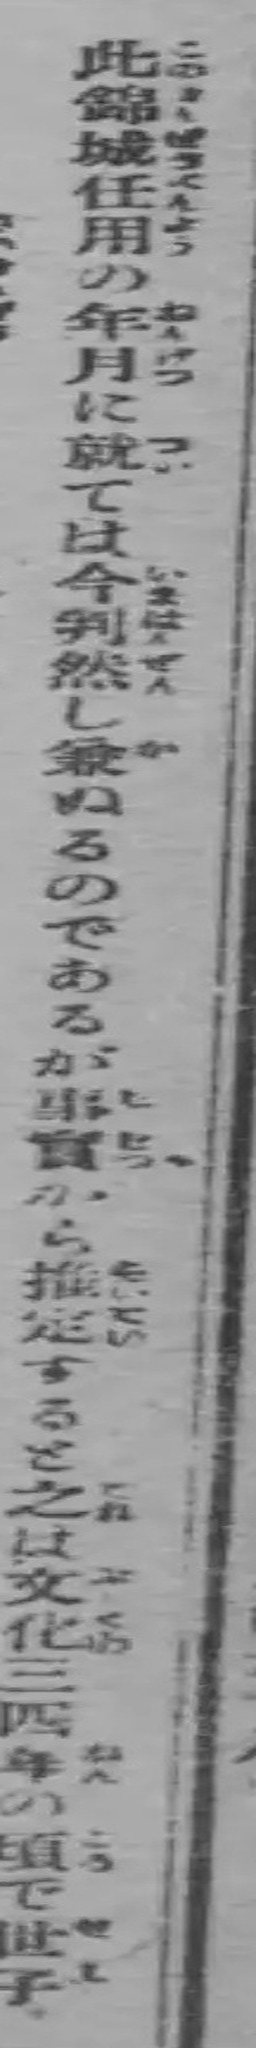此錦城任用の年月に就ては今判然し兼ぬるのであるが事実から推定すると之は文化三四年の頃で世子
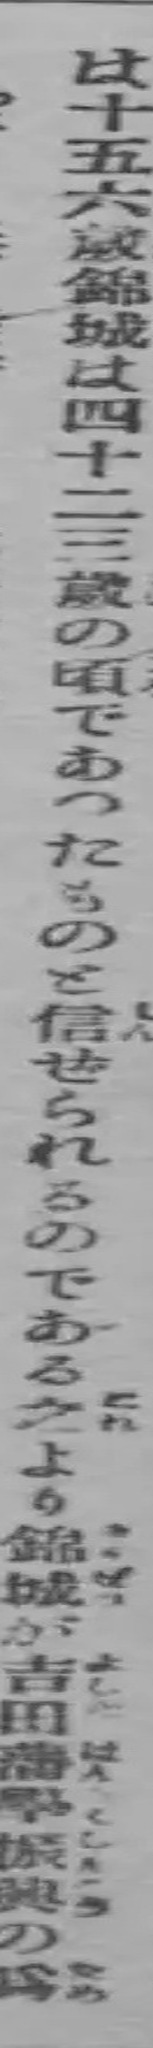は十五六歳錦城は四十二三歳の頃であつたものと信ぜられるのである之より錦城が吉田藩学振興の為
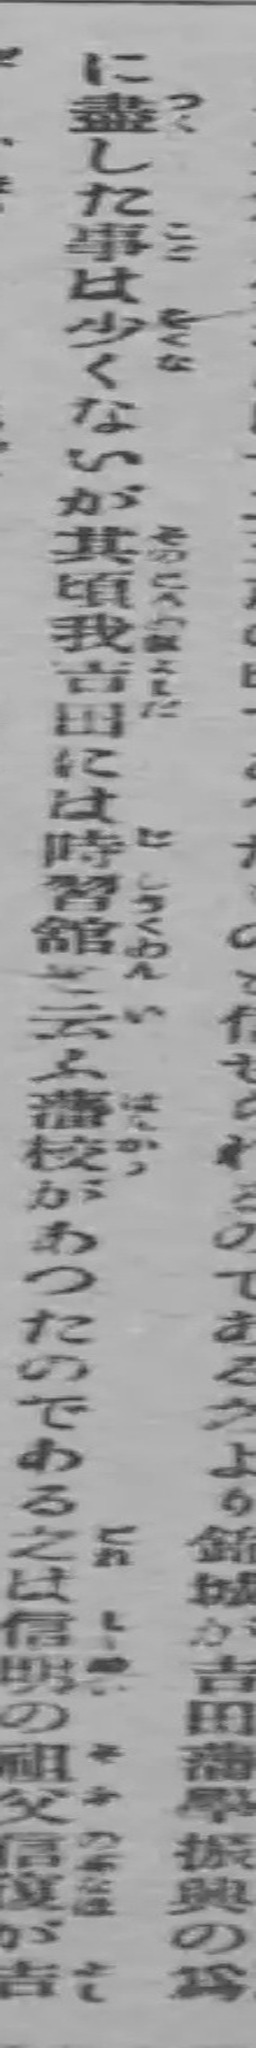時習館に尽した事は少くないが其頃我吉田には時習館と云ふ藩校があつたのである之は信明の祖父信復が吉
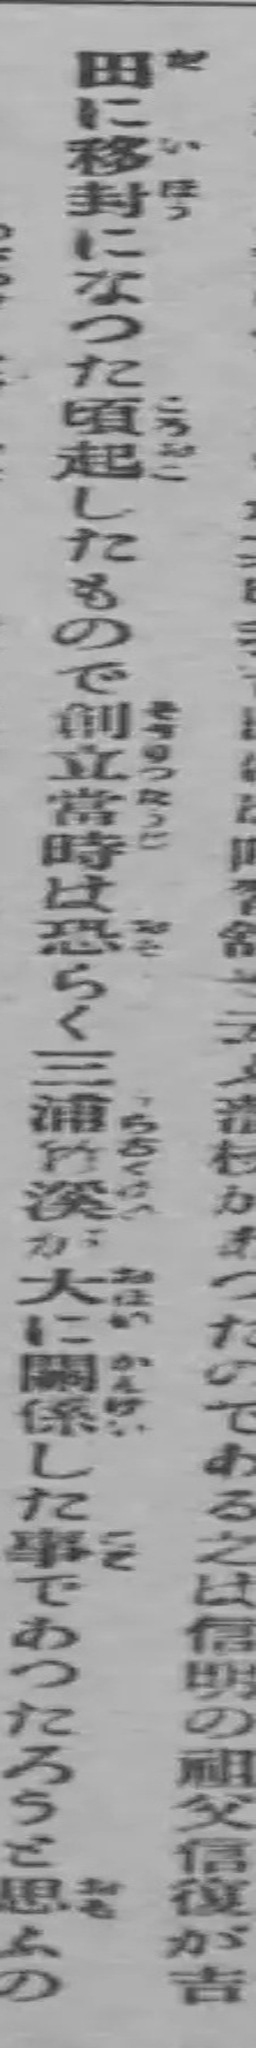田に移封になつた頃起したもので創立当時は恐らく三浦竹渓が大に関係した事であつたろうと思ふの
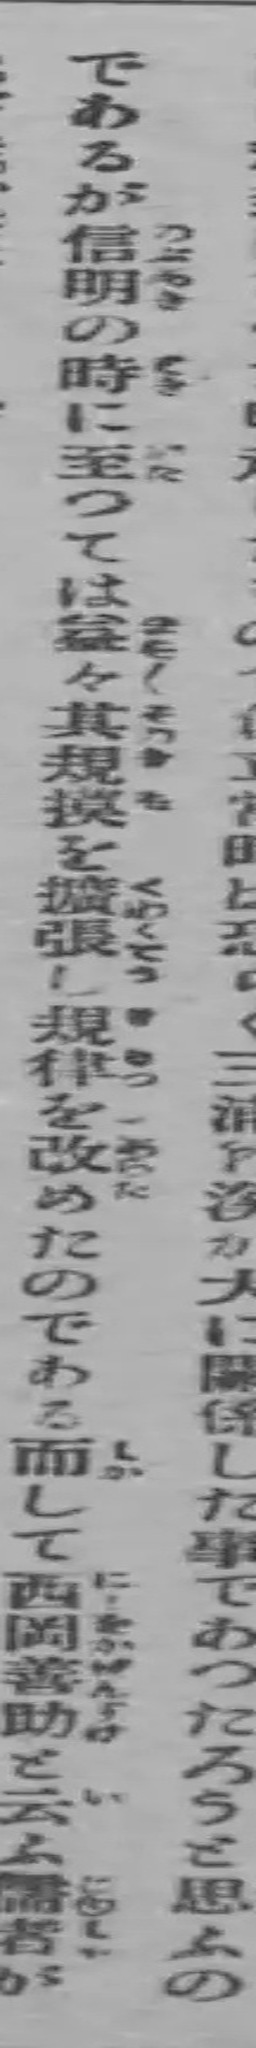であるが信明の時に至つては益々其規模を拡張し規律を改めたのである而して西岡善助と云ふ儒者が
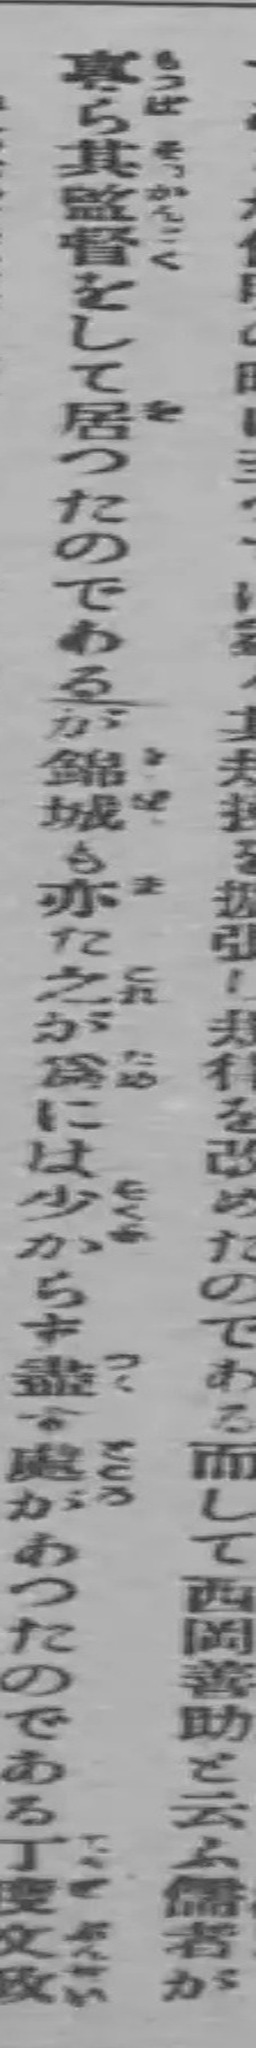専ら其監督をして居つたのであるが錦城も亦た之が為には少からず尽す処があつたのである丁度文政
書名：豊橋市史談
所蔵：国立国会図書館 National Diet Library, JAPAN
